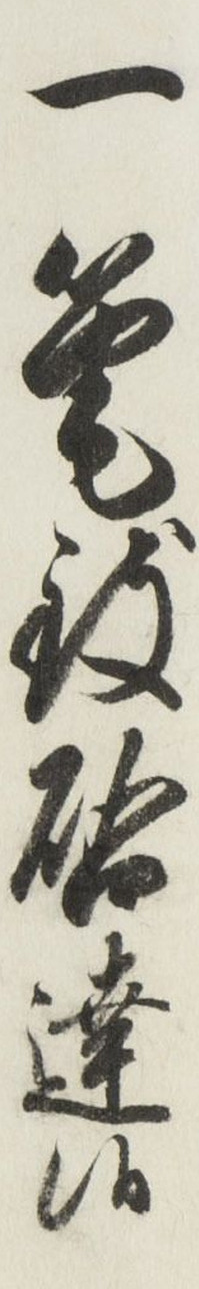一筆致啓達候
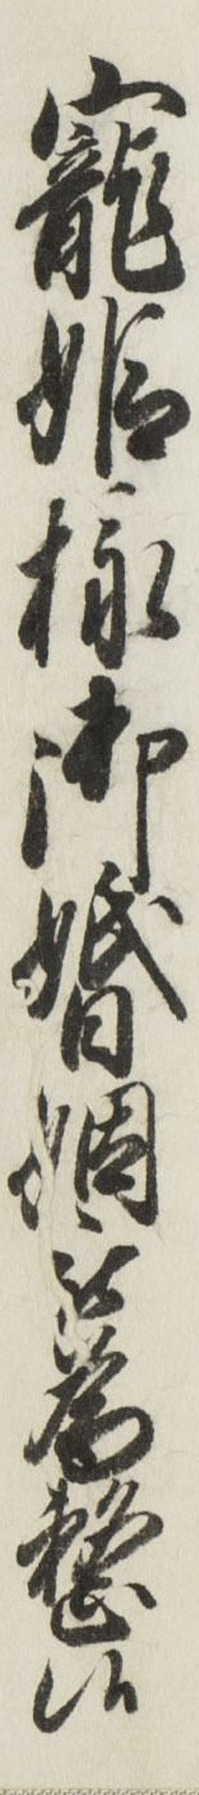寵姫様御婚姻被為整候
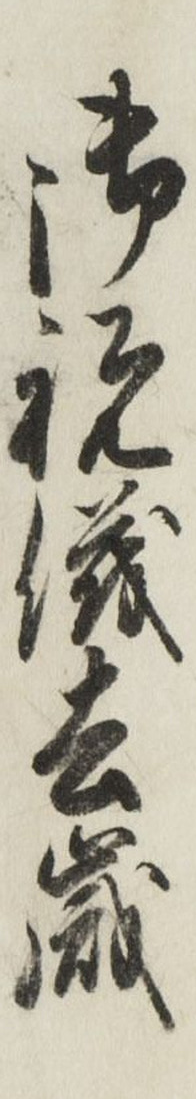御祝儀去歳
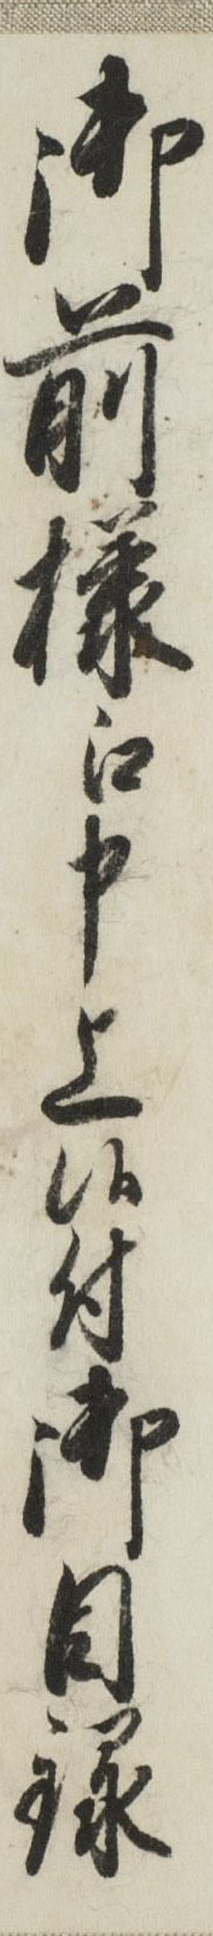御前様江申上候付御目録
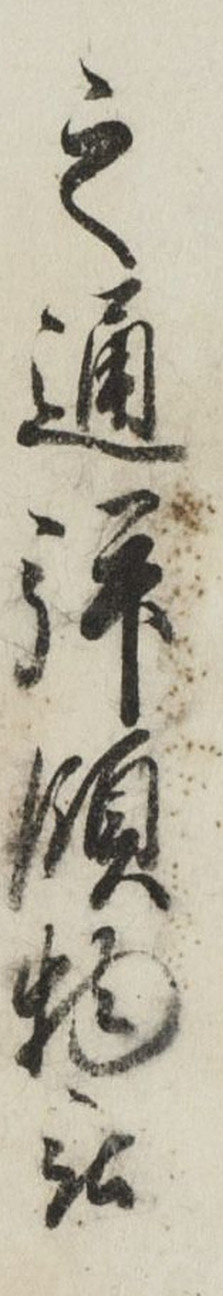之通拝領物被
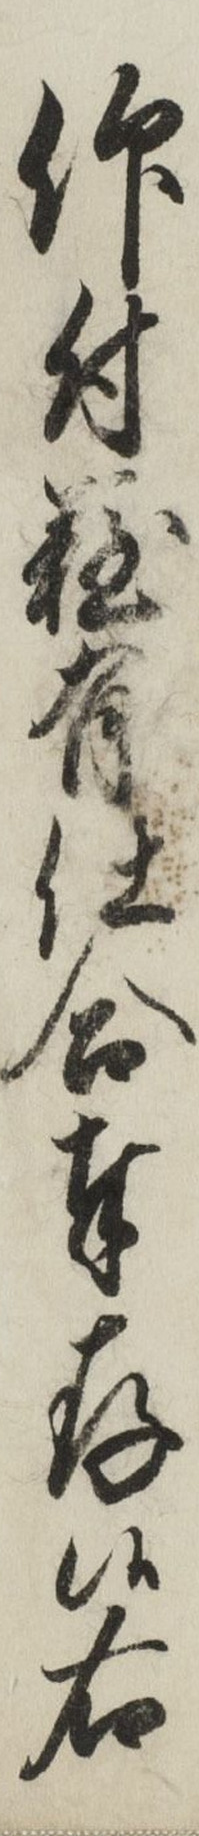仰付難有仕合奉存候右
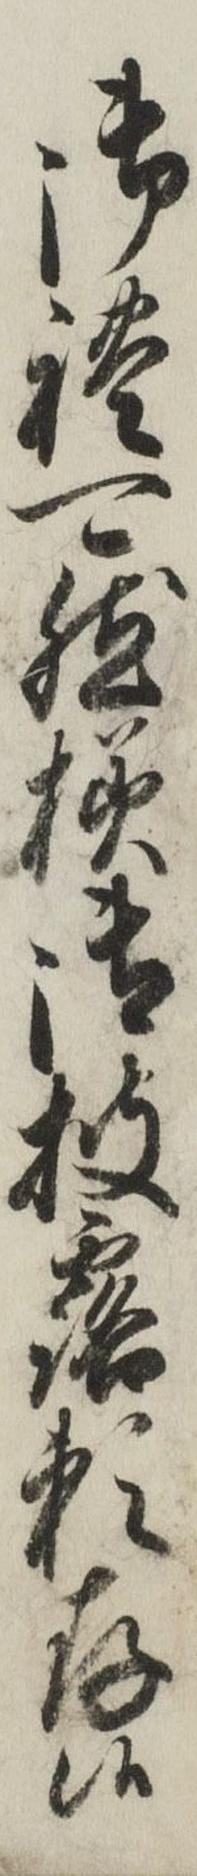御禮可然様御披露頼存候
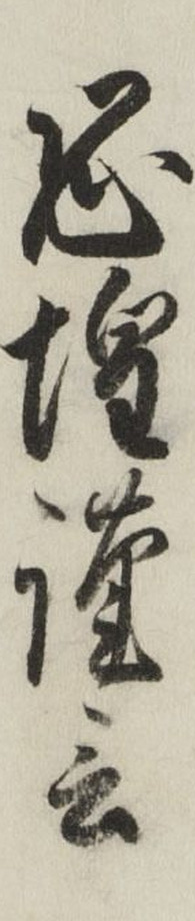恐惶謹言
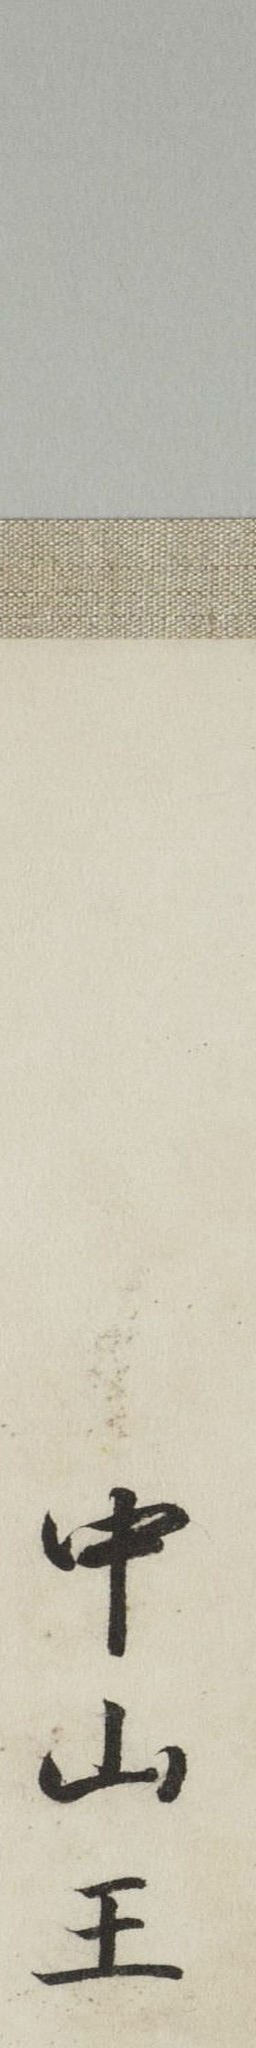中山王
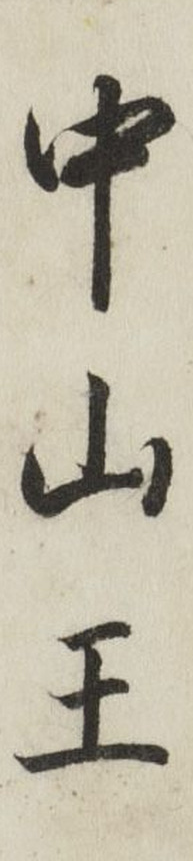中山王
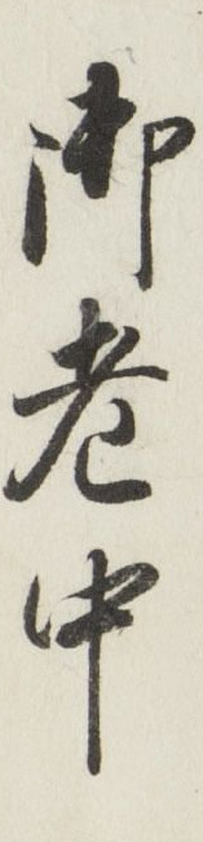御老中
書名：島津家宛花押印状(一) 中山王尚育
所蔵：University of the Ryukyus Library
